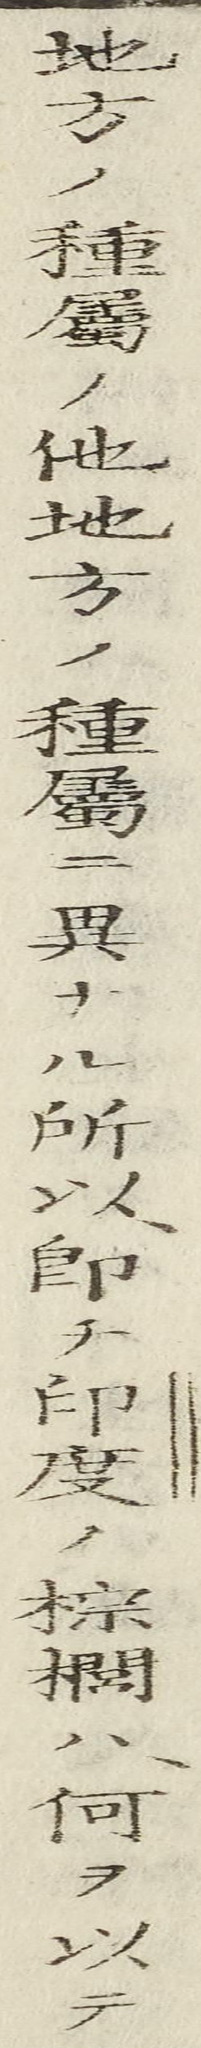地方ノ種属ノ他地方ノ種属ニ異ナル所以、即チ印度ノ棕櫚ハ、何ヲ以テ
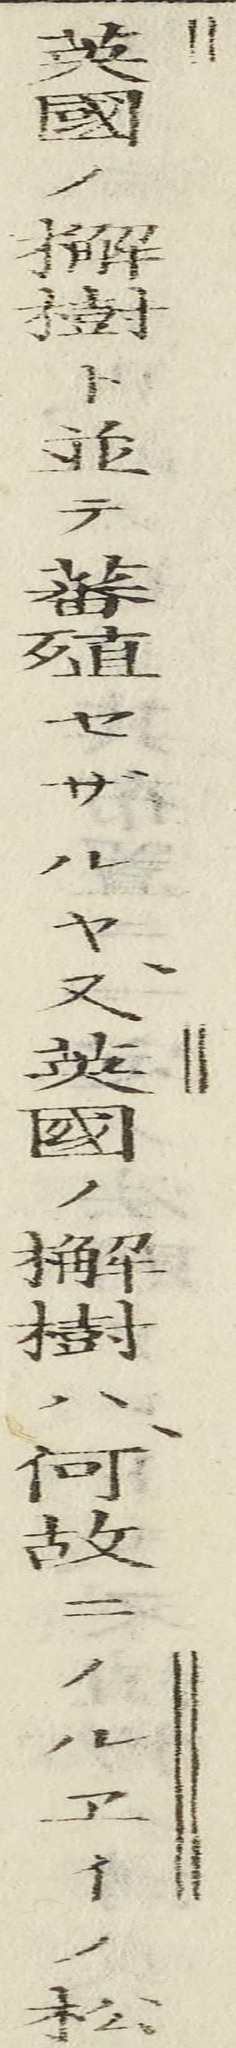英国ノ檞樹ト並テ蕃殖セザルヤ、又英国ノ檞樹ハ、何故ニノルエイノ松
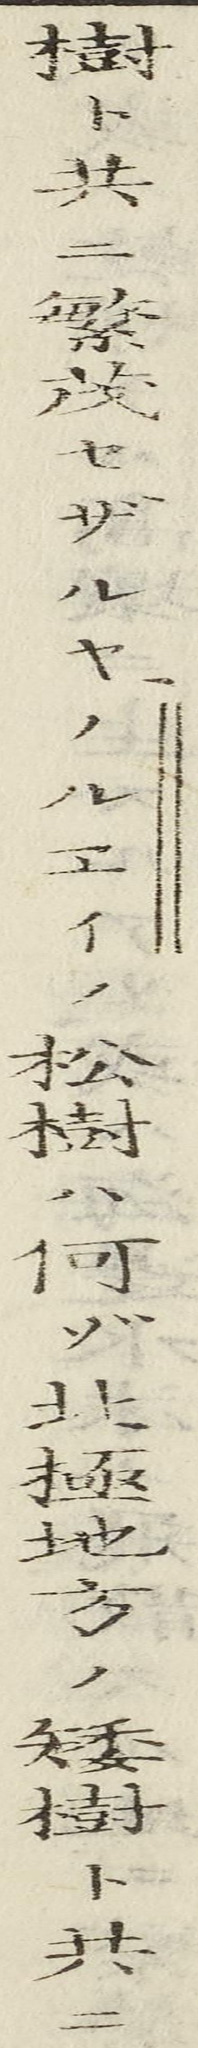樹ト共ニ繁茂セザルヤ、ノルエイノ松樹ハ何ゾ北極地方ノ矮樹ト共ニ
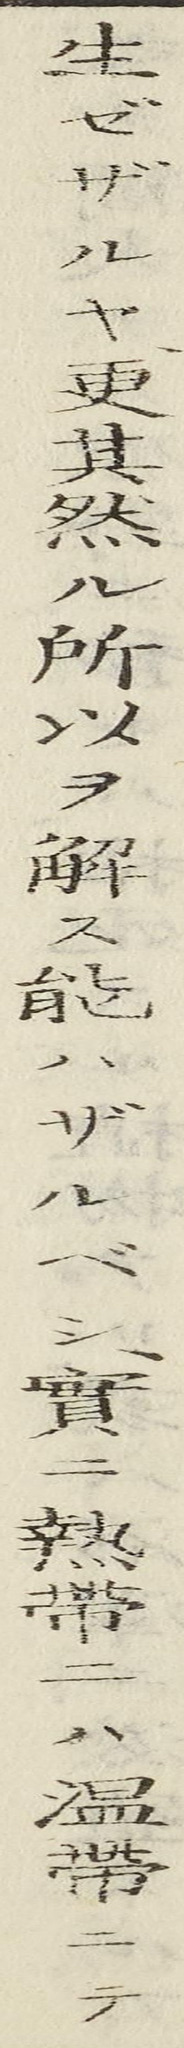生ゼザルヤ、更其然ル所以ヲ解ス能ハザルベシ、実ニ熱帯ニハ温帯ニテ
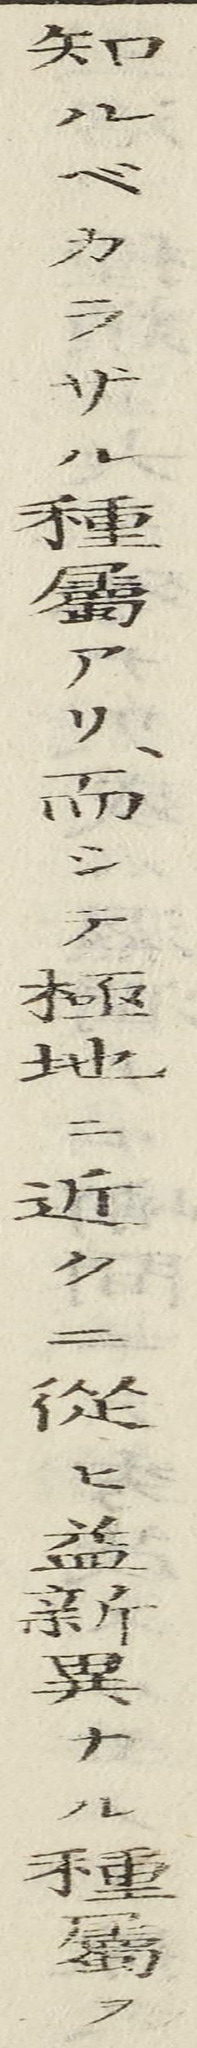知ルベカラザル種属アリ、而シテ極地ニ近クニ従ヒ益新異ナル種属ヲ
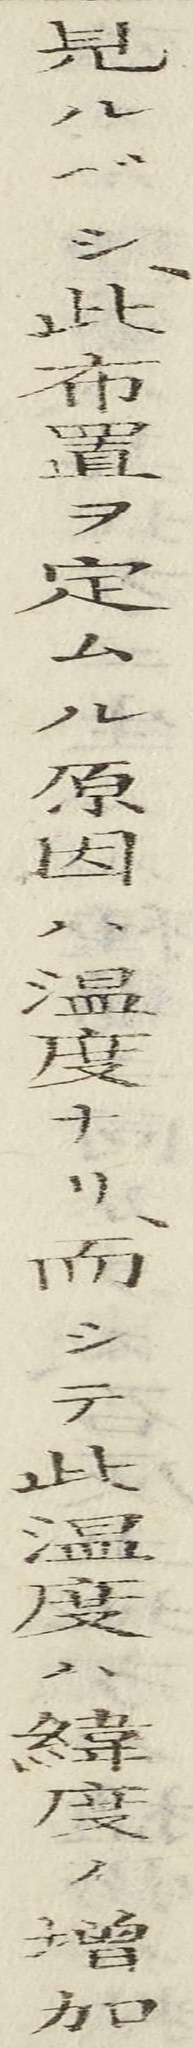見ルベシ、此布置ヲ定ムル原因ハ温度ナリ、而シテ此温度ハ緯度ノ増加
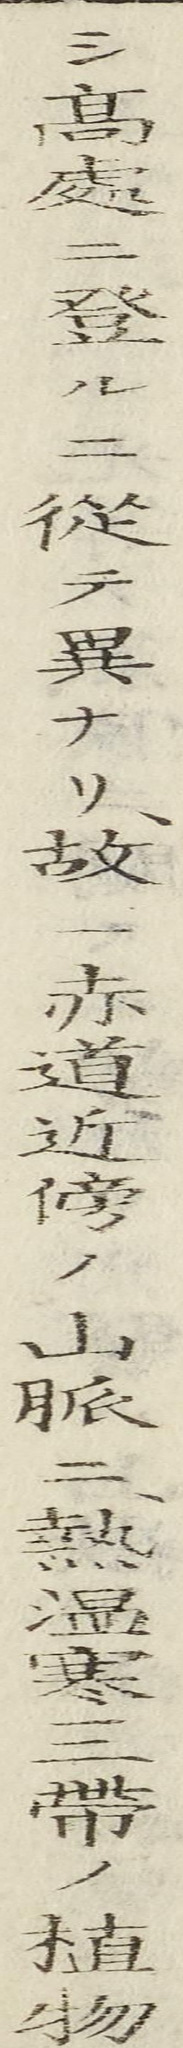シ高処ニ登ルニ従テ異ナリ、故ニ赤道近傍ノ山脈ニ、熱温寒三帯ノ植物
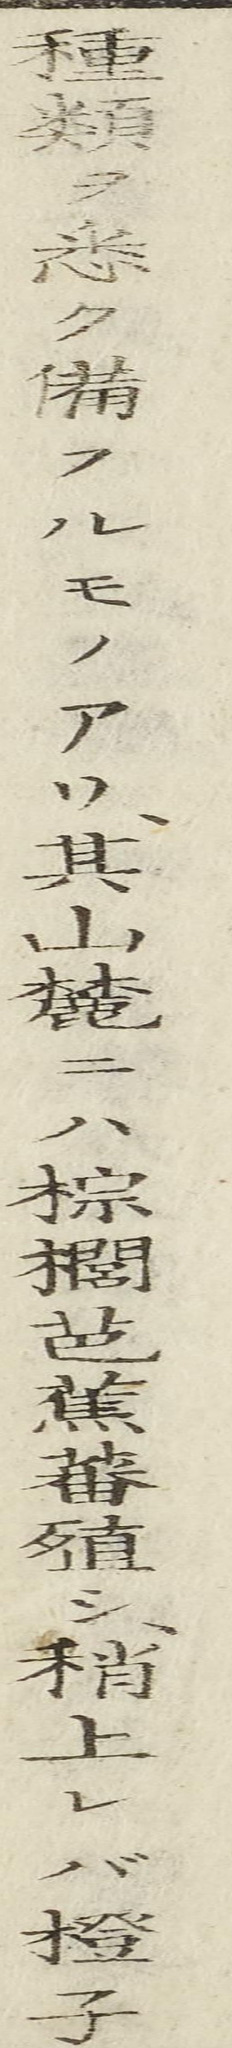種類ヲ悉ク備フルモノアリ、其山麓ニハ棕櫚芭蕉蕃殖シ、稍上レバ橙子
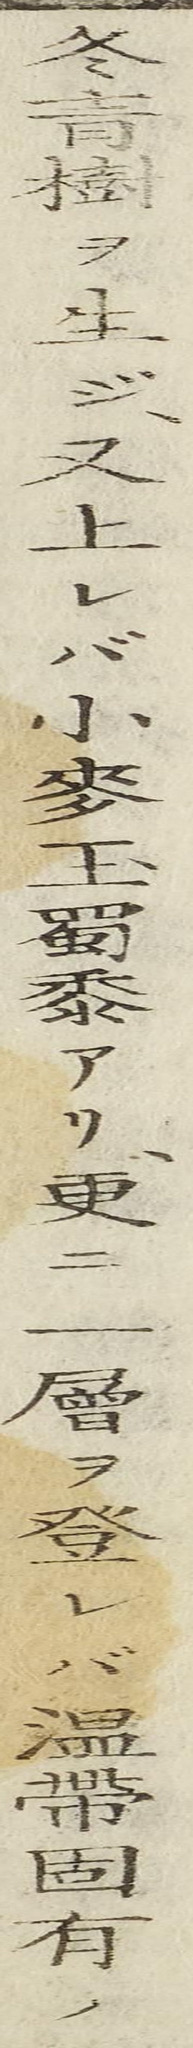冬青樹ヲ生ジ、又上レバ小麦玉蜀黍アリ、更ニ一層ヲ登レバ温帯固有ノ

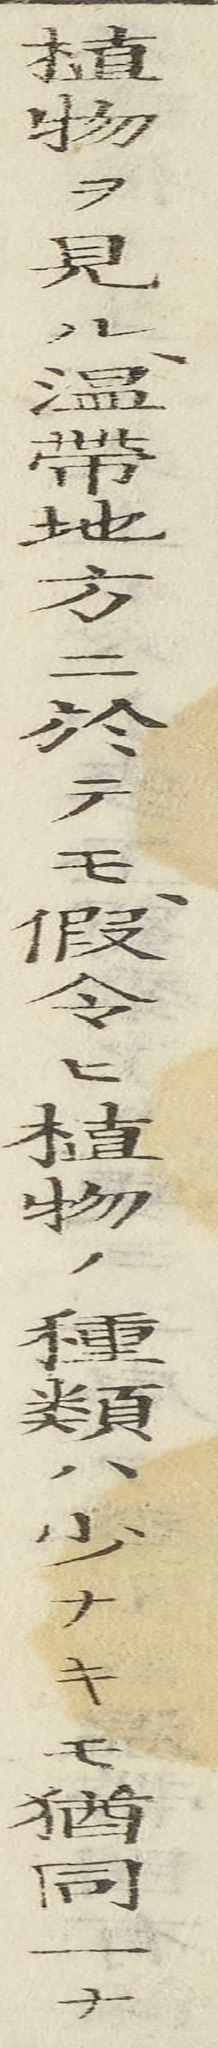植物ヲ見ル、温帯地方ニ於テモ、仮令ヒ植物ノ種類ハ少ナキモ猶同一ナ
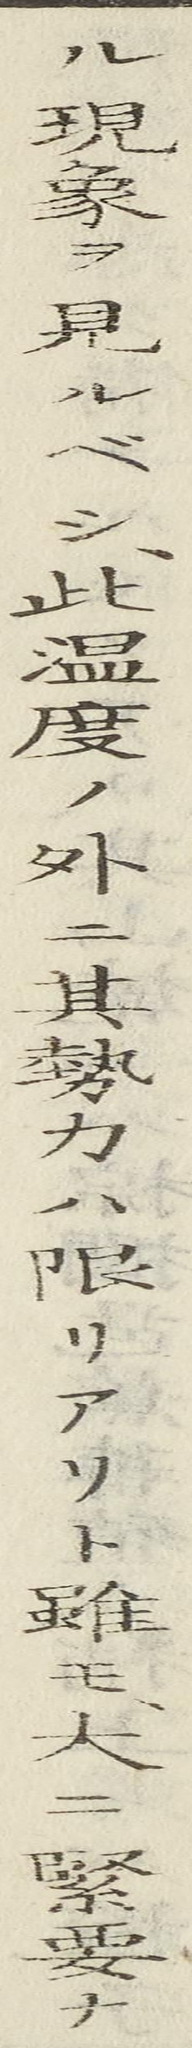ル現象ヲ見ルベシ、此温度ノ外ニ其勢力ハ限リアリト雖モ、大ニ緊要ナ
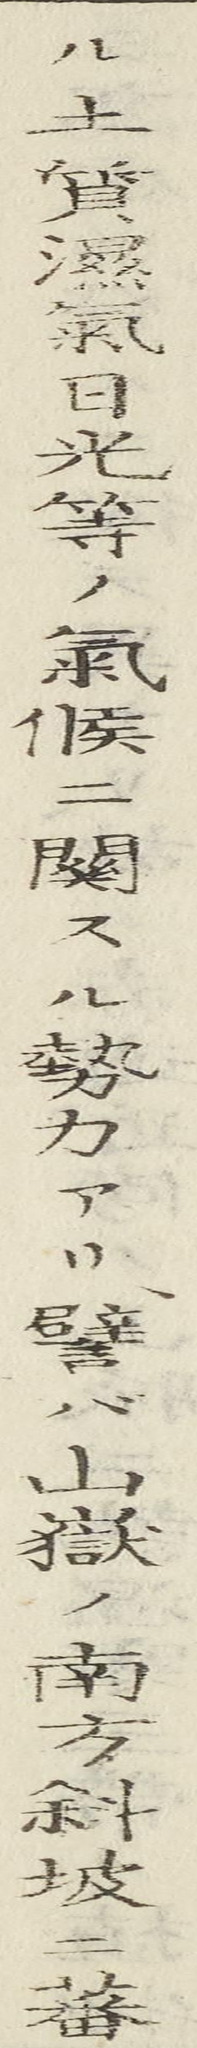ル土質湿気日光等ノ気候ニ関スル勢力アリ、譬バ山嶽ノ南方斜坡ニ蕃
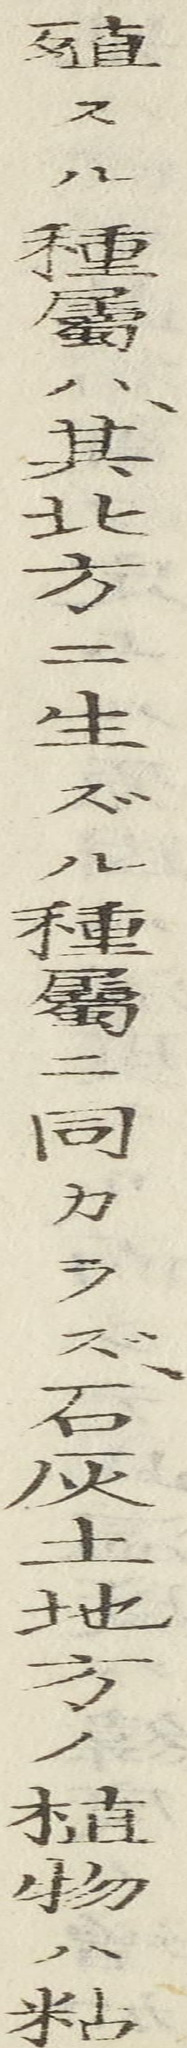殖スル種属ハ、其北方ニ生ズル種属ニ同カラズ、石灰土地方ノ植物ハ粘
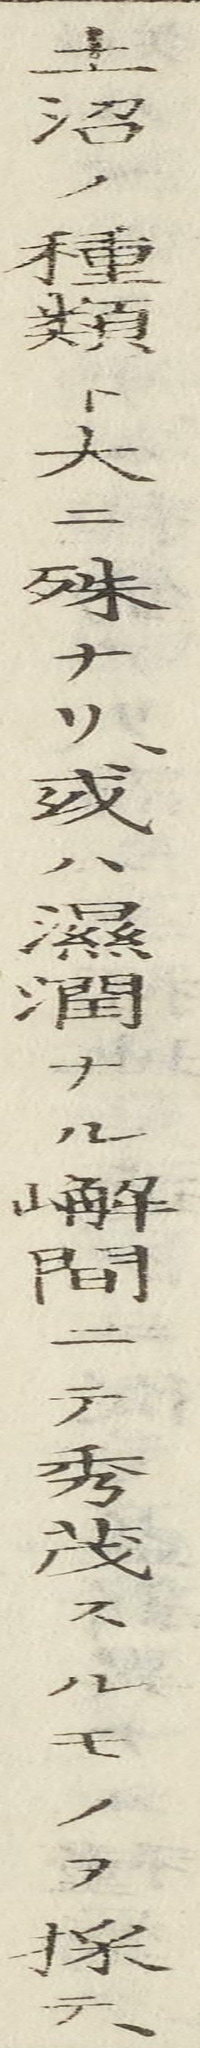土沼ノ種類ト大ニ殊ナリ、或ハ湿潤ナル嶰間ニテ秀茂スルモノヲ採テ、
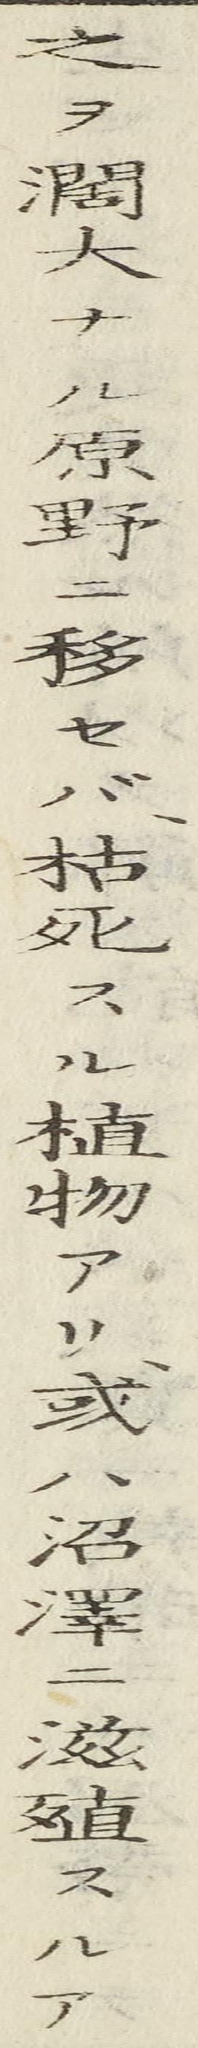之ヲ濶大ナル原野ニ移セバ、枯死スル植物アリ、或ハ沼沢ニ滋殖スルア
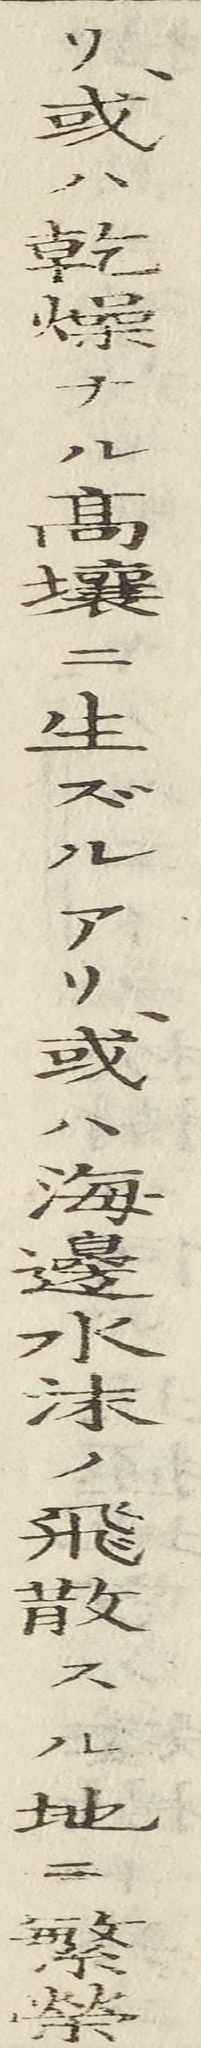リ、或ハ乾燥ナル高壌ニ生ズルアリ、或ハ海辺水沫ノ飛散スル地ニ繁栄
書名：百科全書　地文學　全
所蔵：東京大学地震研究所図書室 Earthquake Research Institute Library, The University of Tokyo, JAPAN
